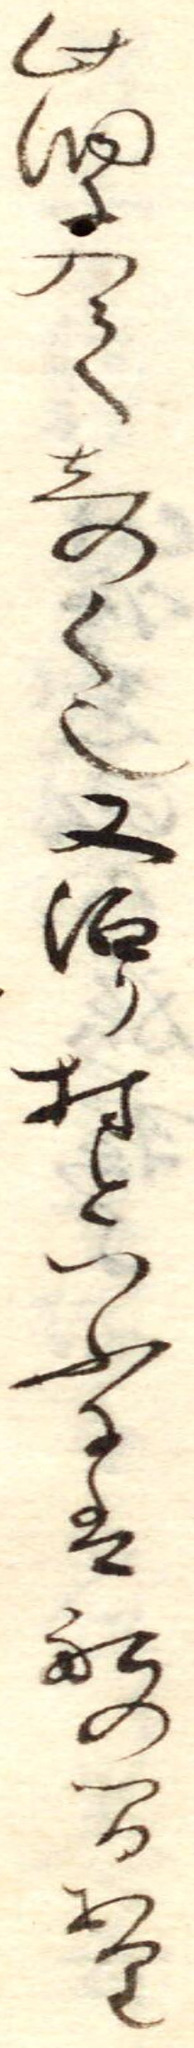此洞に入てしのく也又泊り村といふには船の間あり
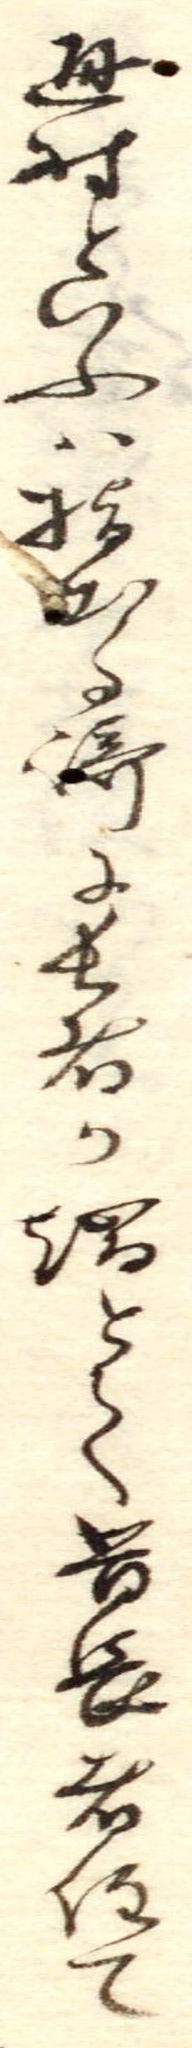通村といふは指出る崎に長者か端とて昔長者住て
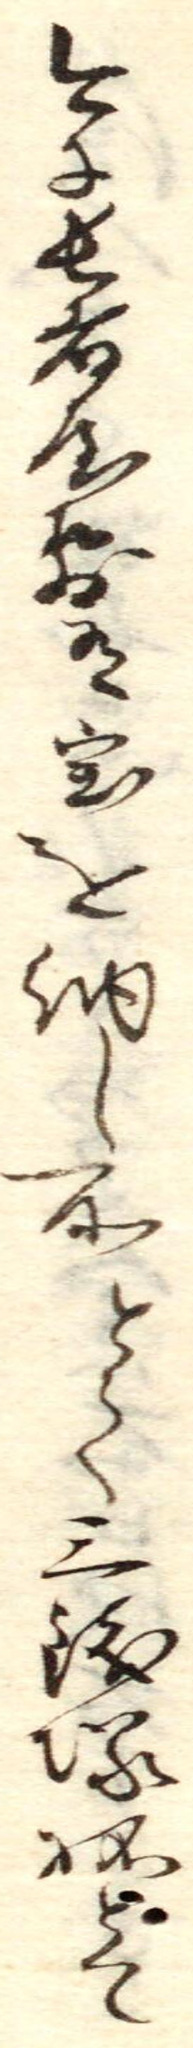今に長者屋敷有宝を納し所とて三銭塚抔とて
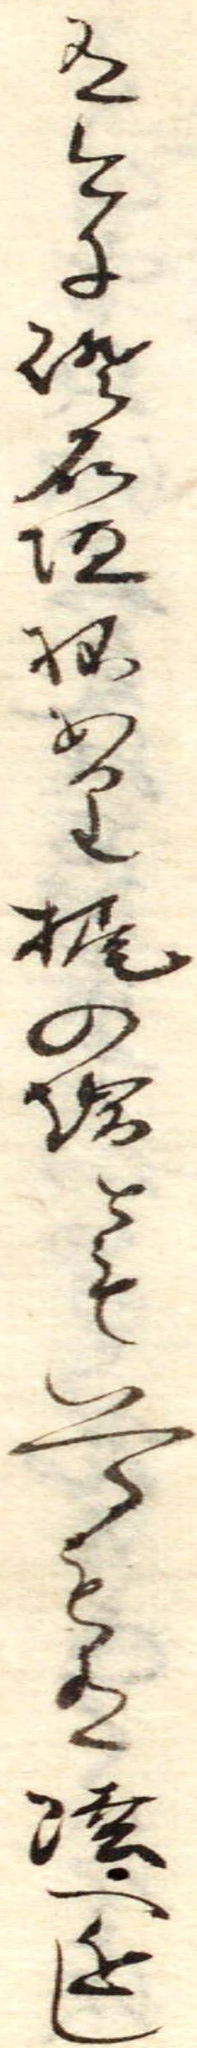有今に礎石垣抔あり梶の端ともいへるも有陸へ近し
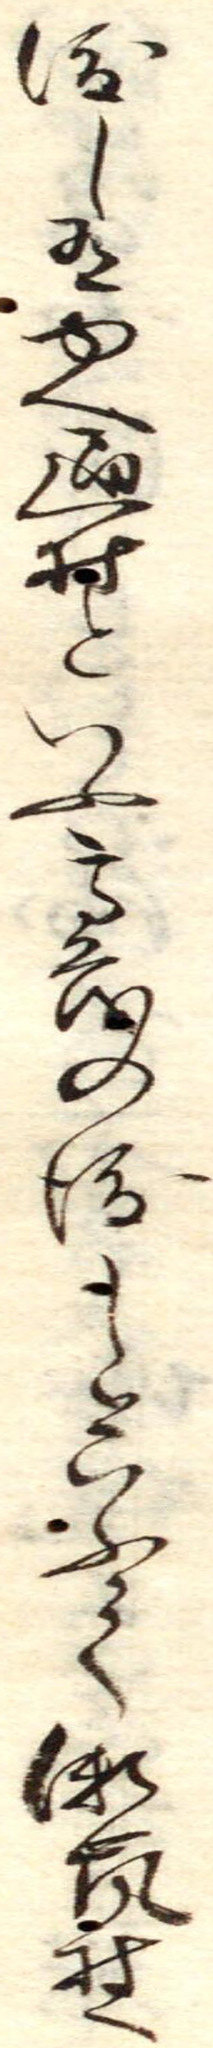渡し有ゆへ通村といふ高茂の渡しといふて瀬嵐村へ
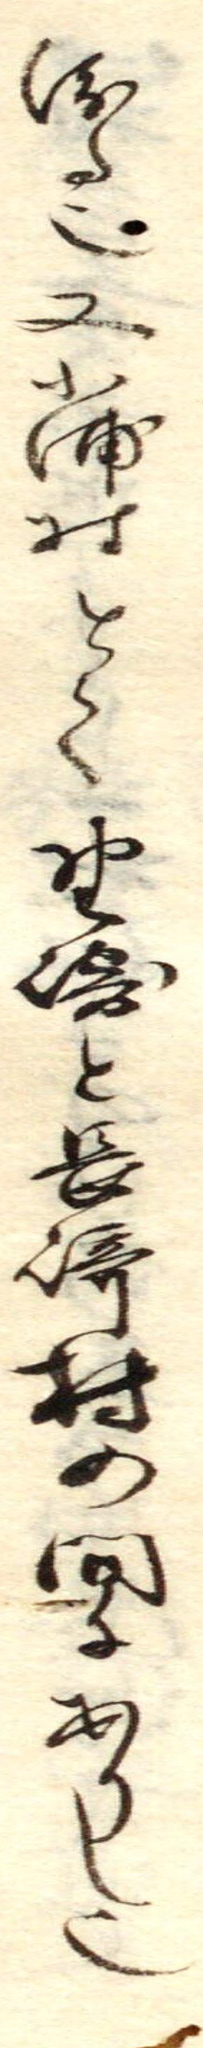渡る也又小浦村とて野崎と長崎村の間にありし也

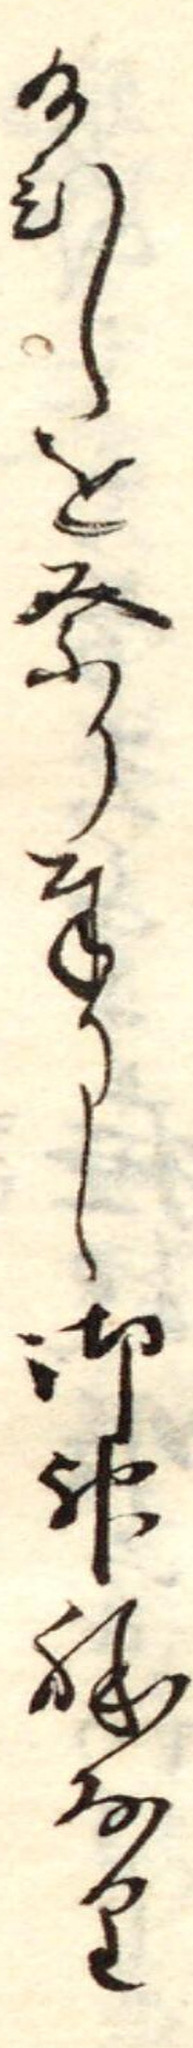給ひしを祭り奉りし御神躰なり
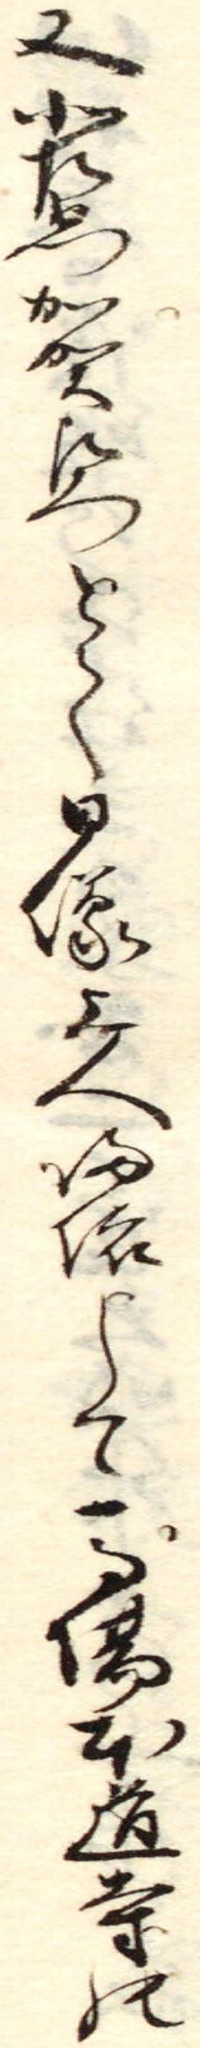又北左衛門加賀左衛門とて日像上人帰依して馬場本道寺の
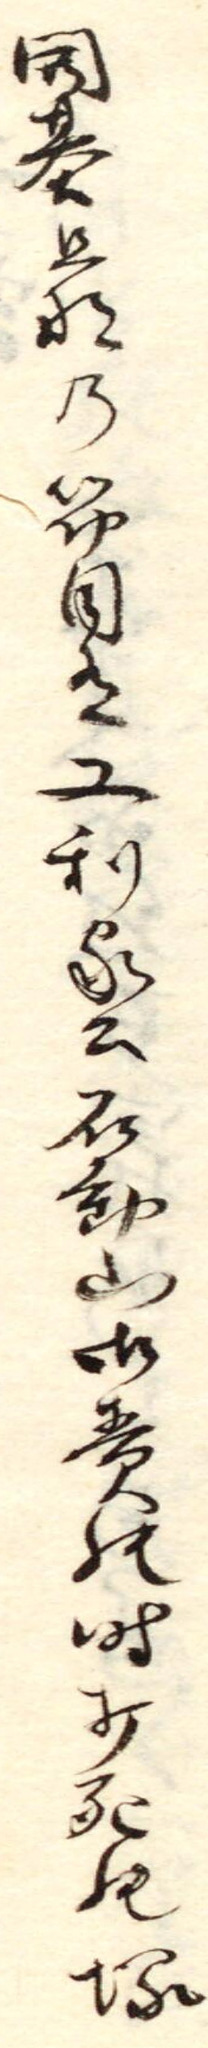開基旦那の筋目有又利家公石動山御責の時打死の塚
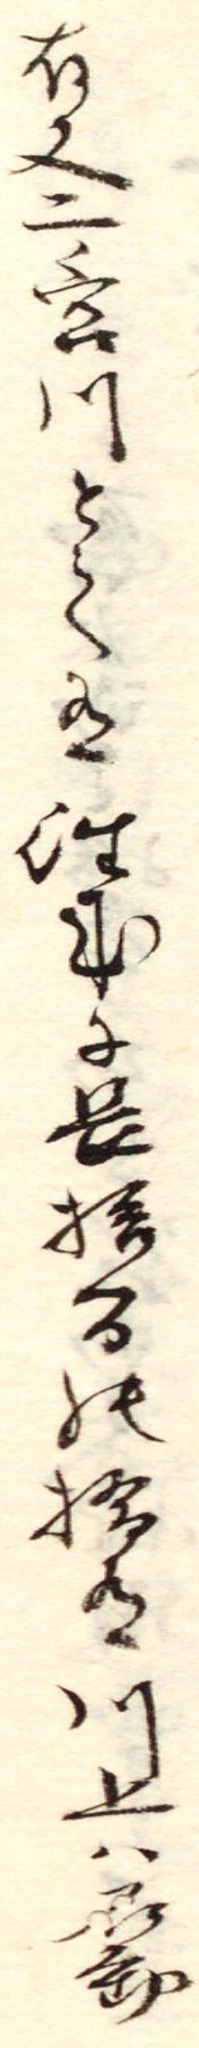有又二ノ宮川とて有往来に長拾間の橋有川上は石動
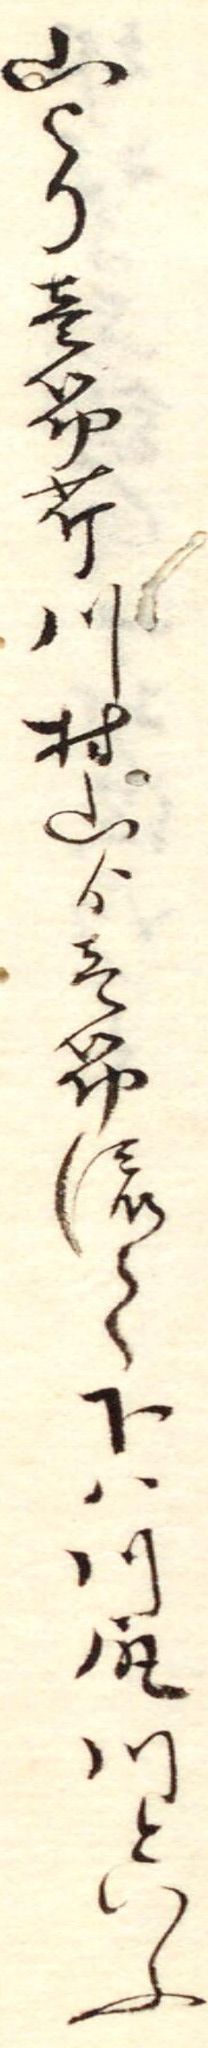山より壱筋芹川村山ゟ壱筋流て下は川尻川といふ
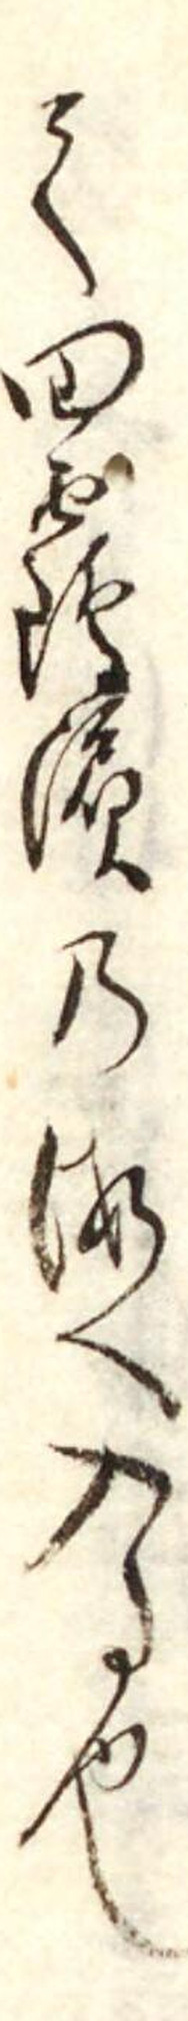て田鶴浜の海へ入る也
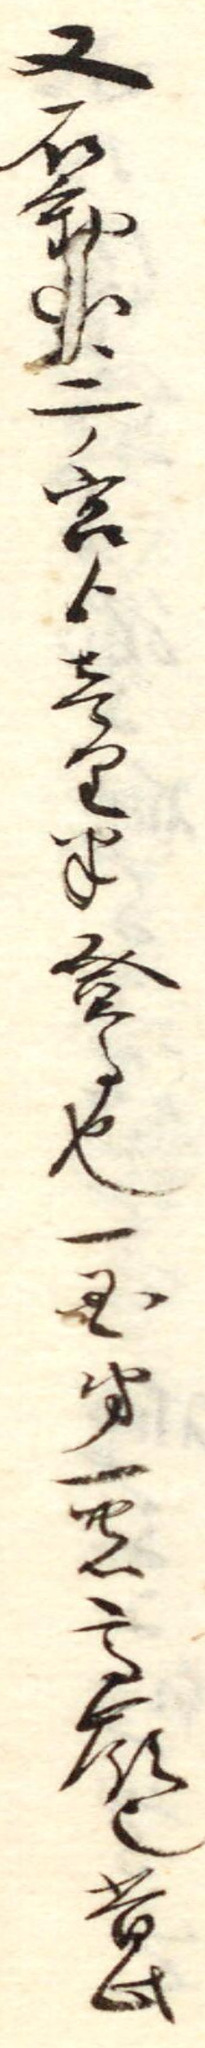又石動山は二ノ宮ゟ壱里半登る也一国第一の高嶺也昔此
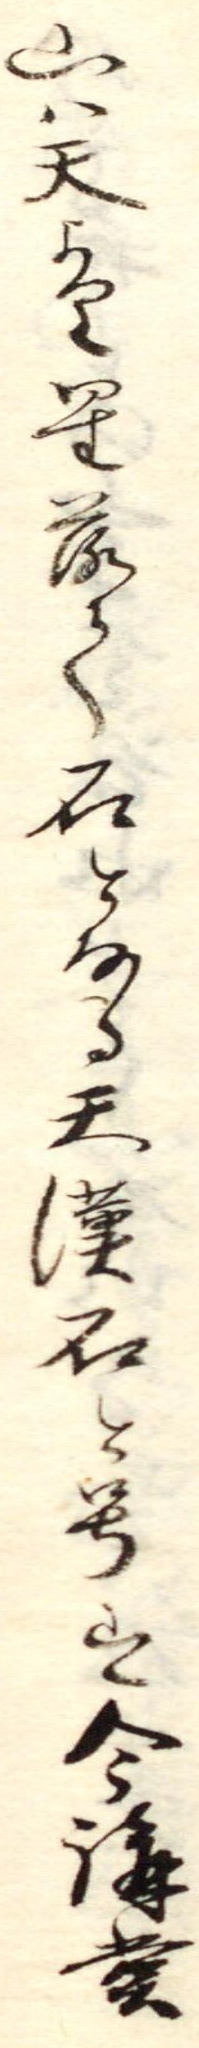山は天より星落て石となる天漢石と号す今講堂
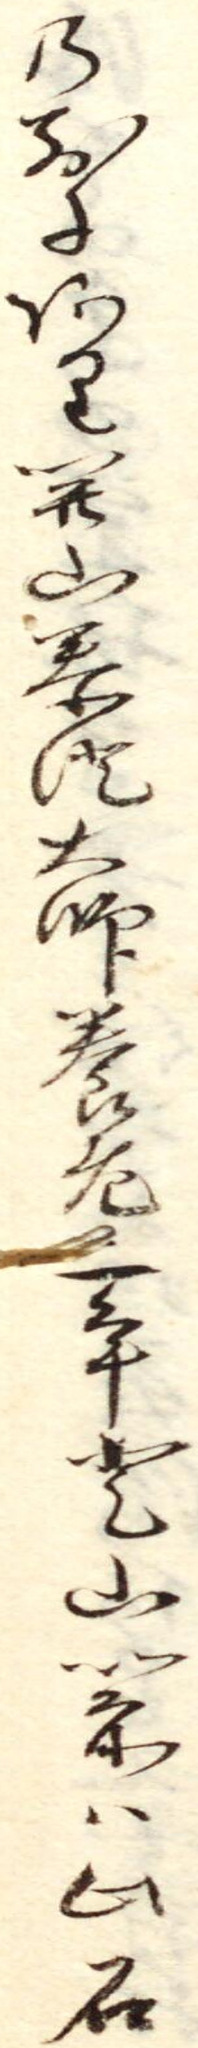の前にあり開山泰澄大師養老二年登山以前は此名
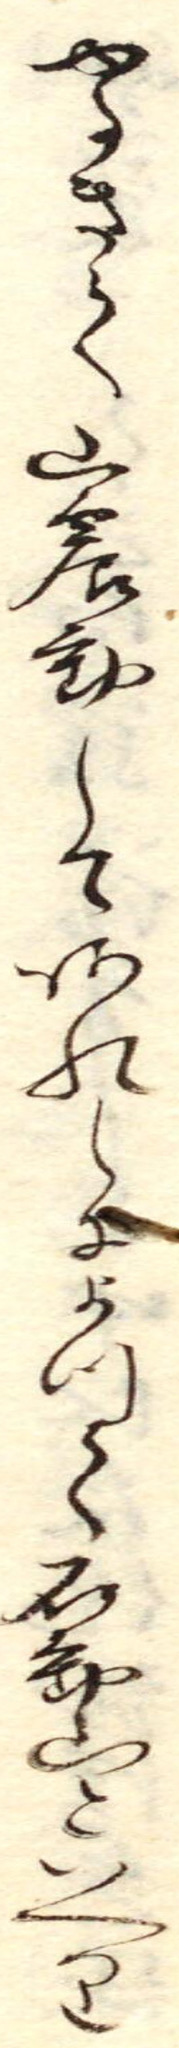ゆるきて山震動してあれしによつて石動山といへり
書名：能登名跡誌
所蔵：Ishikawa Prefectural Library
